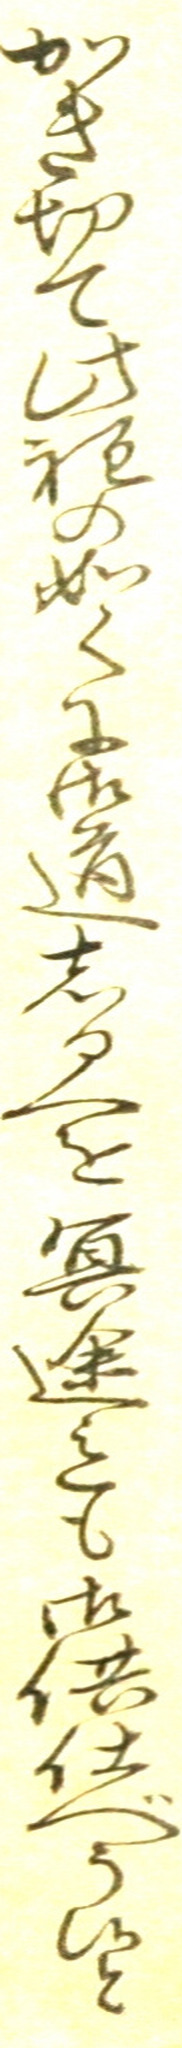かき切て此程の如くに御道しるへを冥途迄も御供仕べう候と

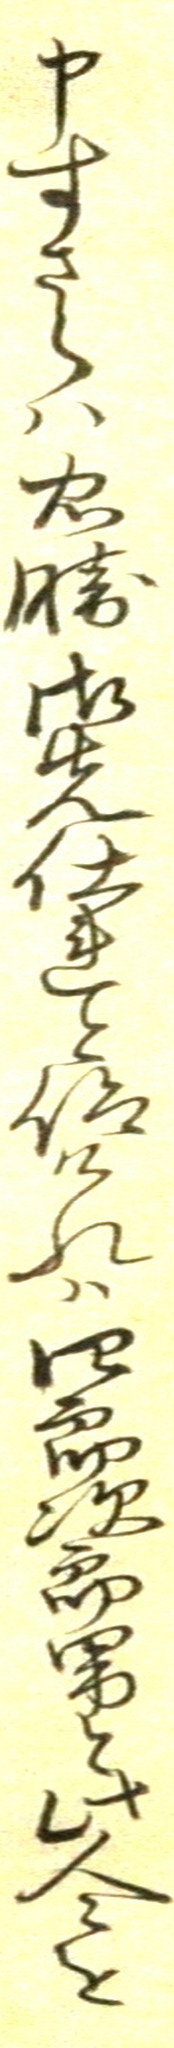申すさらは忠勝御先仕れと仰けれは四郎次郎男と此人々を
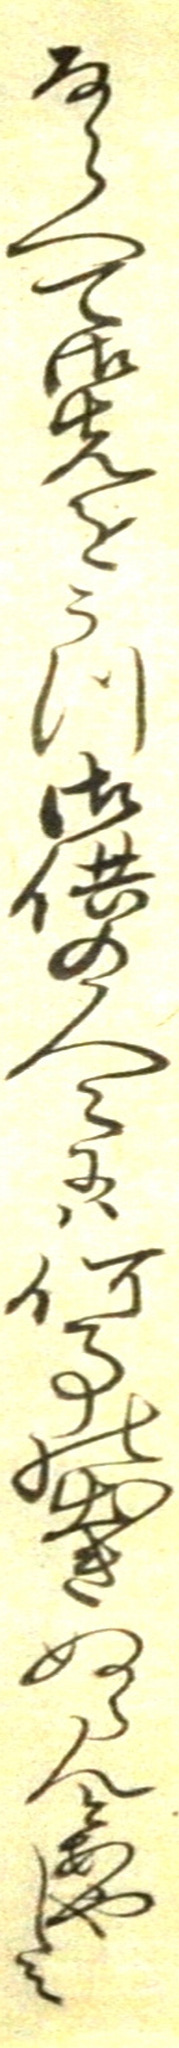ならへて御先をうつ御供の人々には何事の出きぬらんとあやしみ
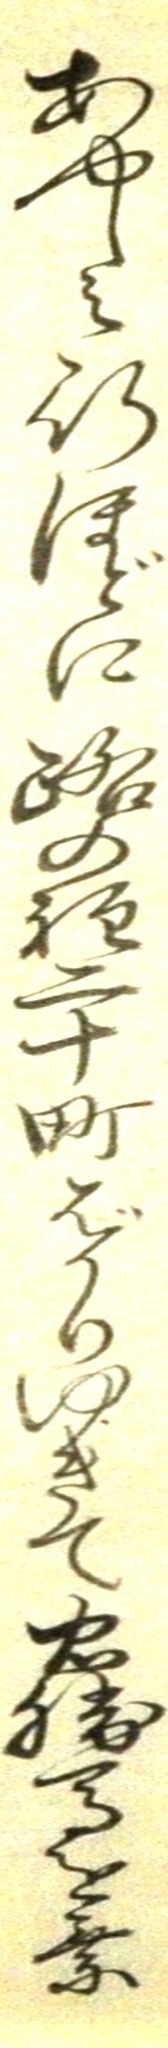あやしみ行ほどに路の程二十町ばかりゆきて忠勝馬を乗
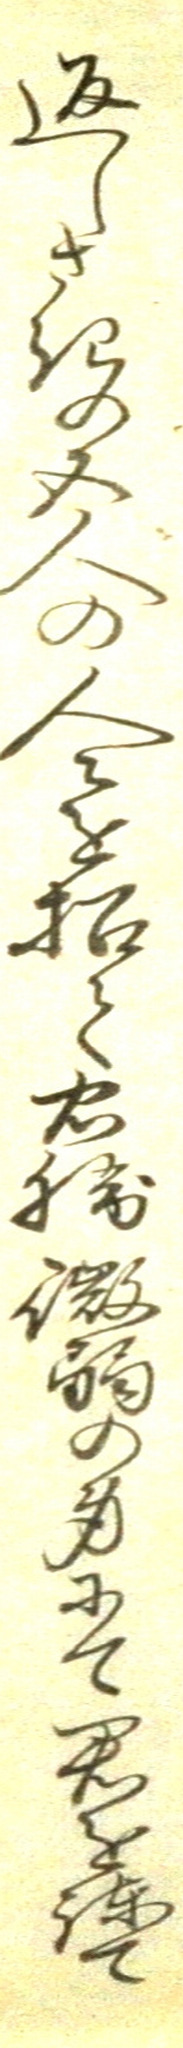返しさきの五人の人々を招て忠勝微弱の身にて君を諫て
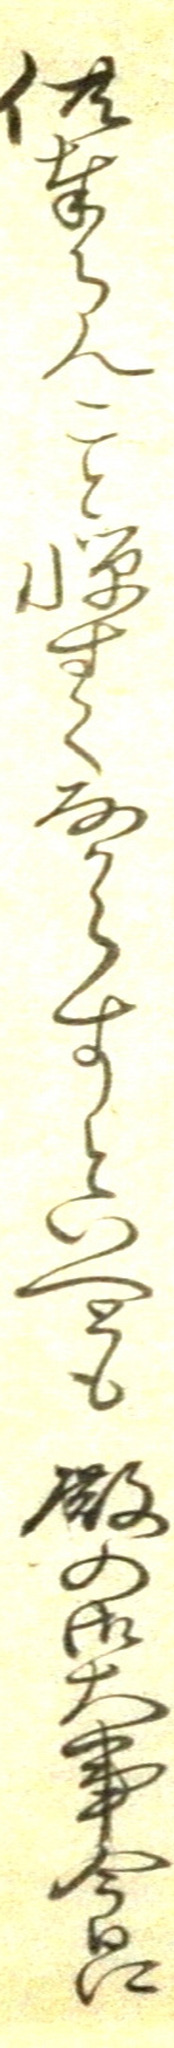供奉らんこと憚すくなからすといへとも殿の御大事今日に
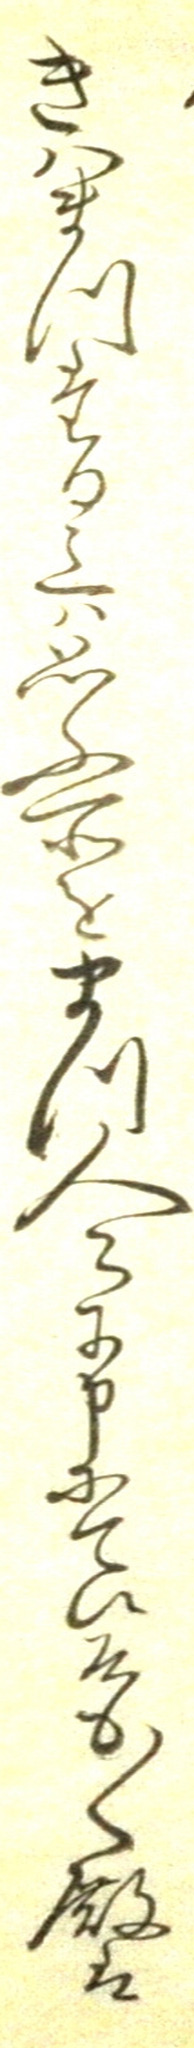きはまつたる上は思ふ所をまつ人々に申にて候そも〳〵殿は
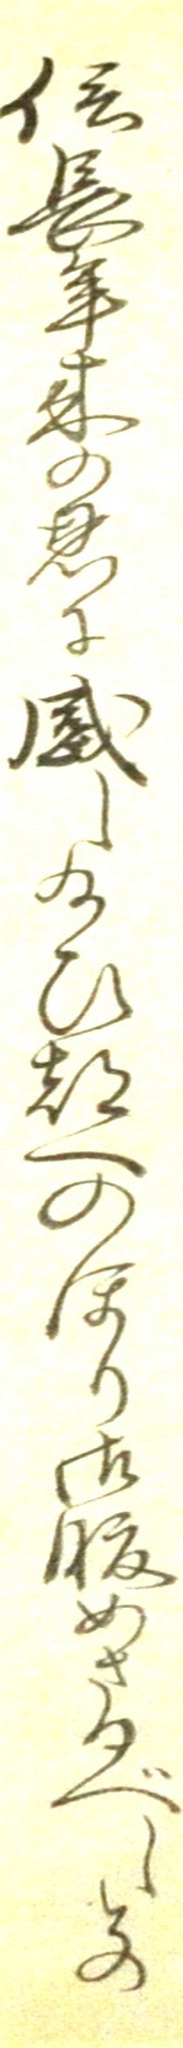信長年来の恩に感し給ひ都へのほり御腹めさるべしとの
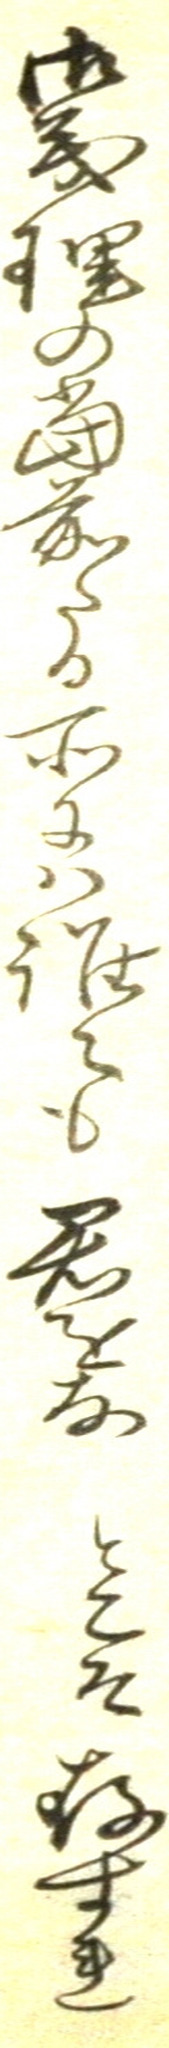御義理の当前たる所には誰にも君をなとこそ存すれ
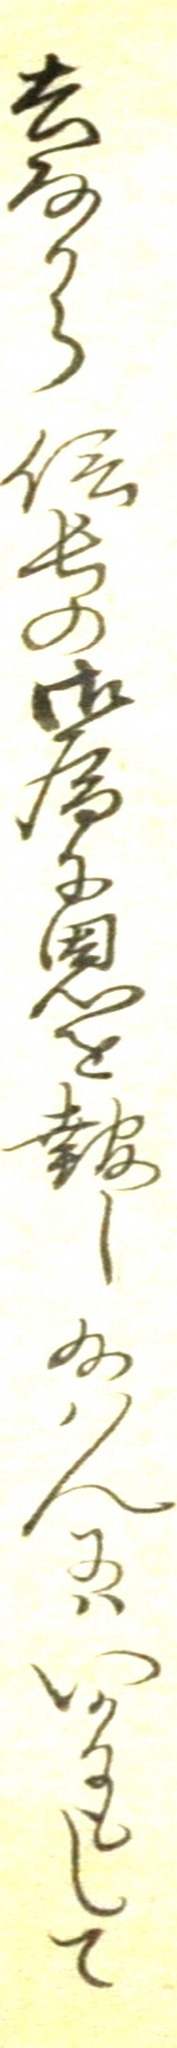去なから信長の御為に恩を報し給はんにはいかにもして
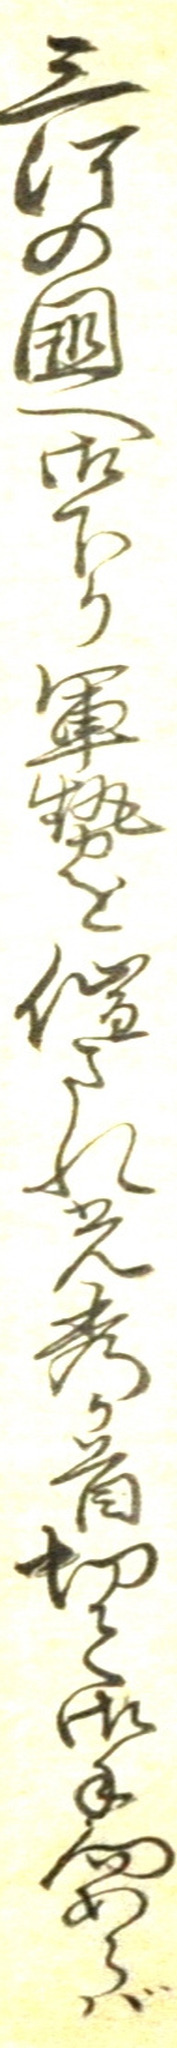三河の国へ御下り軍勢を催され光秀か首切て御手向あらば
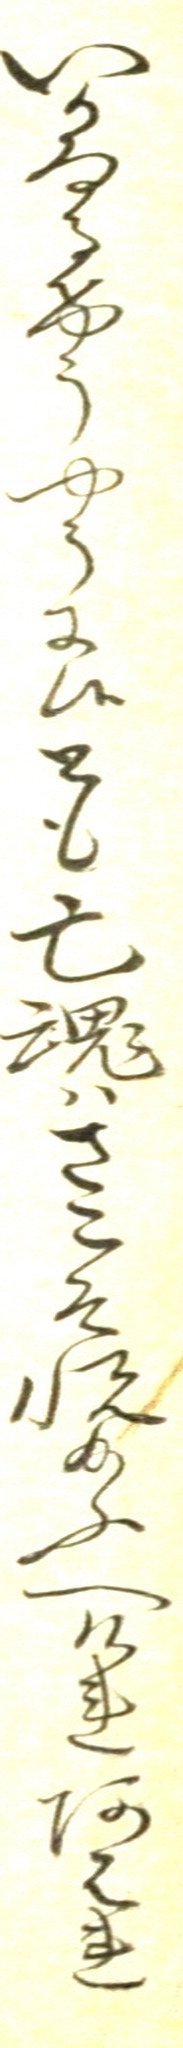いかなるけうやうに候とも亡魂はさこそ悦給ふへけれあはれ
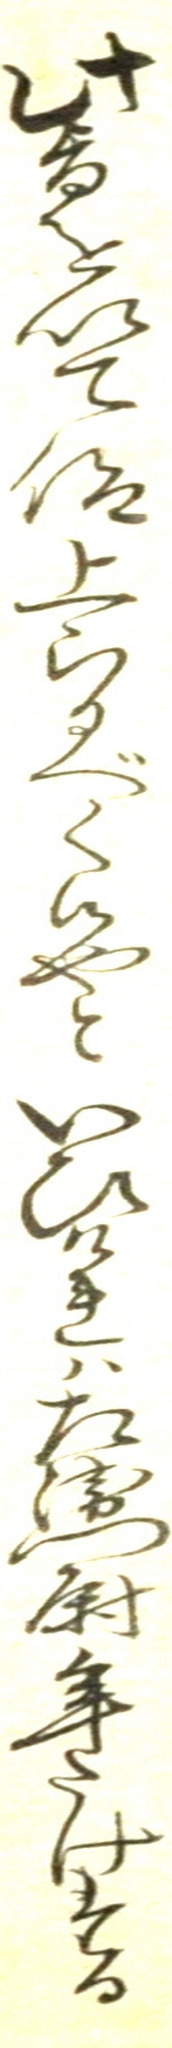此旨を以て仰上らるべく候やといひけれは左衛門尉年たけたる
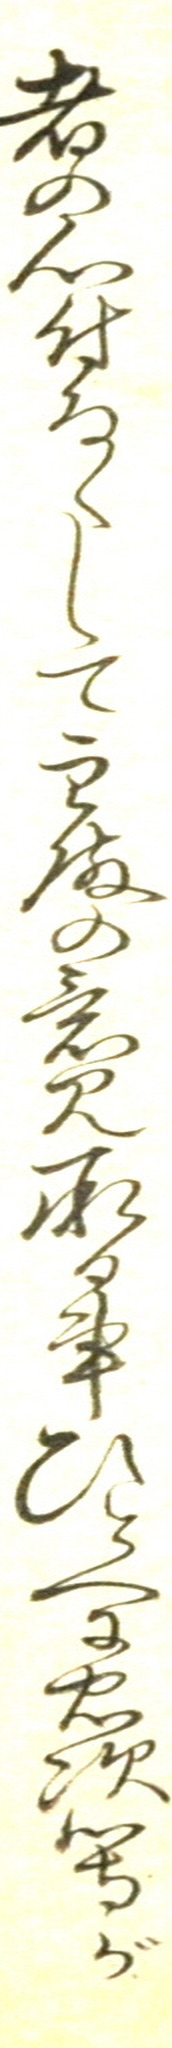者の心付なくして主殿の意見承る事ひとへに忠次等が
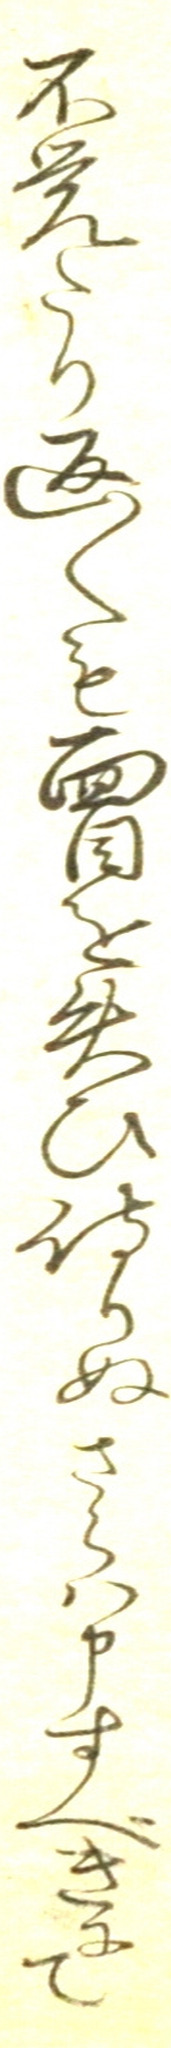不覚たり返〳〵も面目を失ひ侍りぬさらは申すべきにて
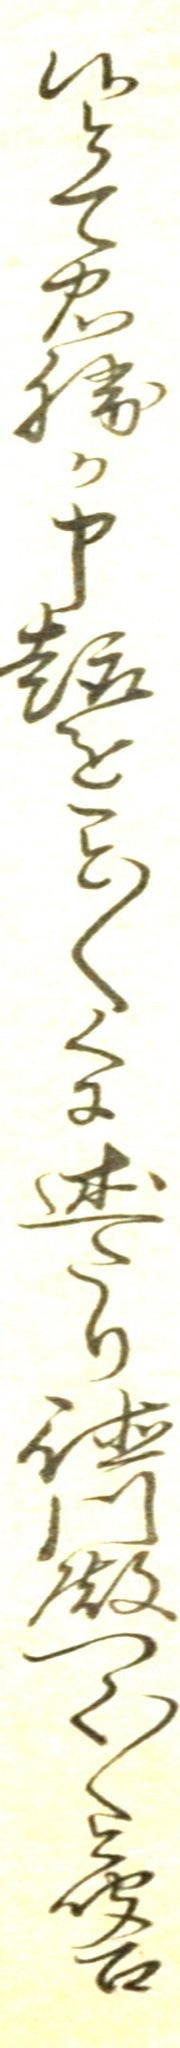候とて忠勝か申趣をこと〳〵くに述たり徳川殿つく〳〵と聞召
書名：藩翰譜（四・上）
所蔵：伊那市立高遠町図書館・合同会社AMANE
